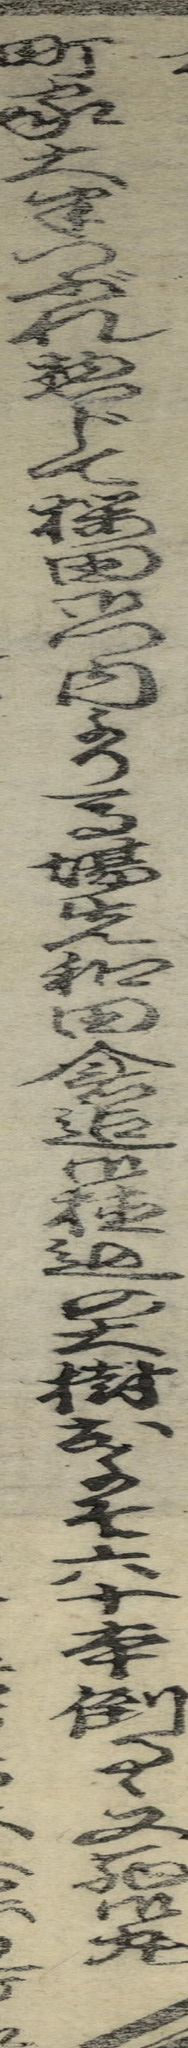町家大半つぶれ惣じて桜田御門内より馬場先和田倉迄御植込の大樹およそ六十本倒るゝ又西御丸
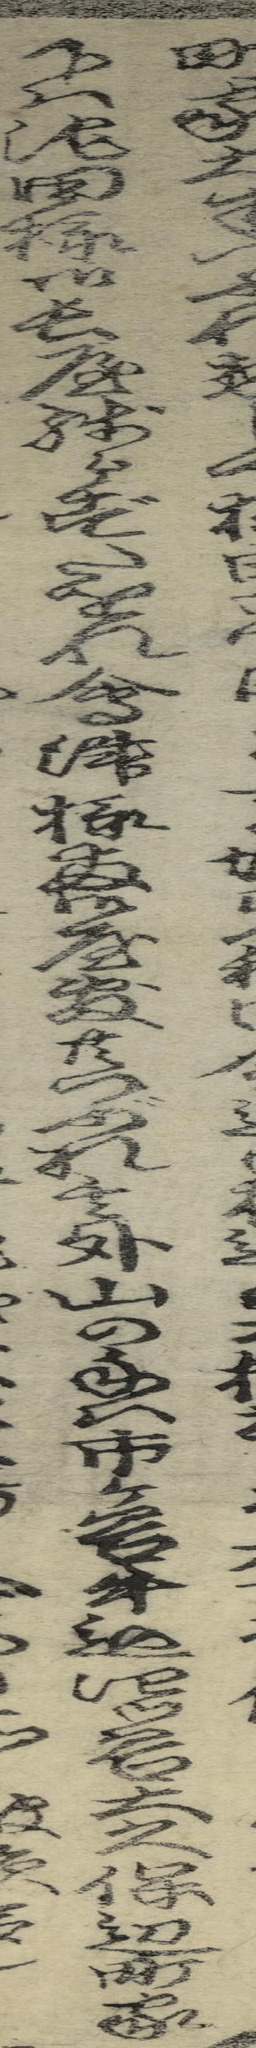下は池田様御長屋残らずたをれ会津様兩御屋敷共つぶれ其外山の手は市ヶ谷牛込四ッ谷大久保辺町家
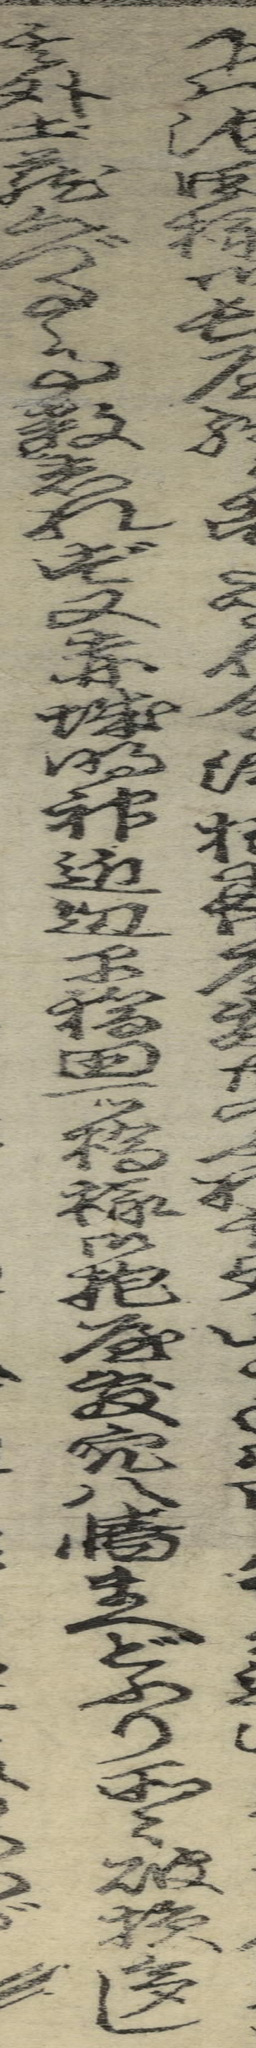其外土蔵くづるゝ事数しれず又赤城明神近辺早稲田一ッ橋様御抱屋敷穴八幡まへどふり所々破損多し
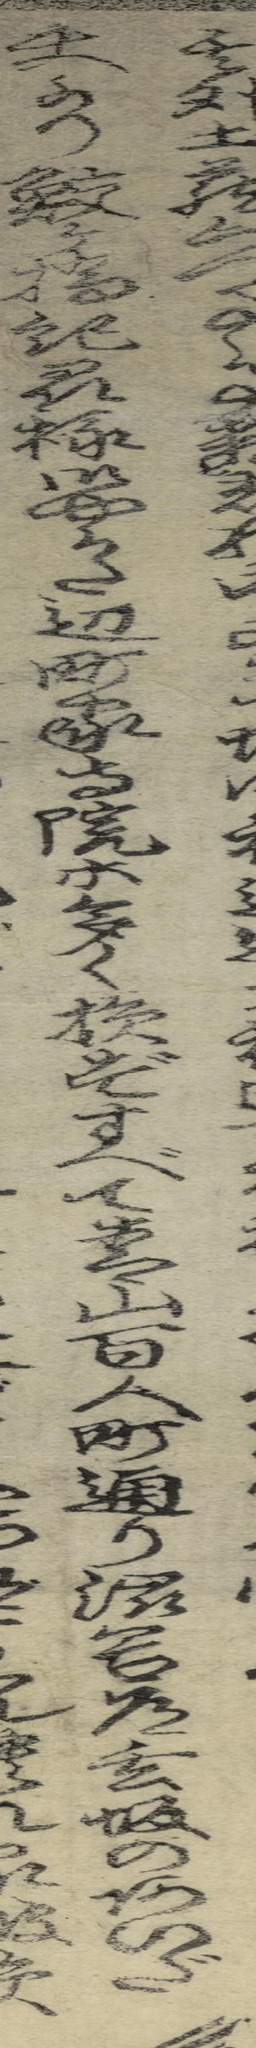夫より鮫ヶ橋紀州様御やかた辺町家寺院等多く損ずすべて青山百人町通り渋谷道玄坂のあいだ
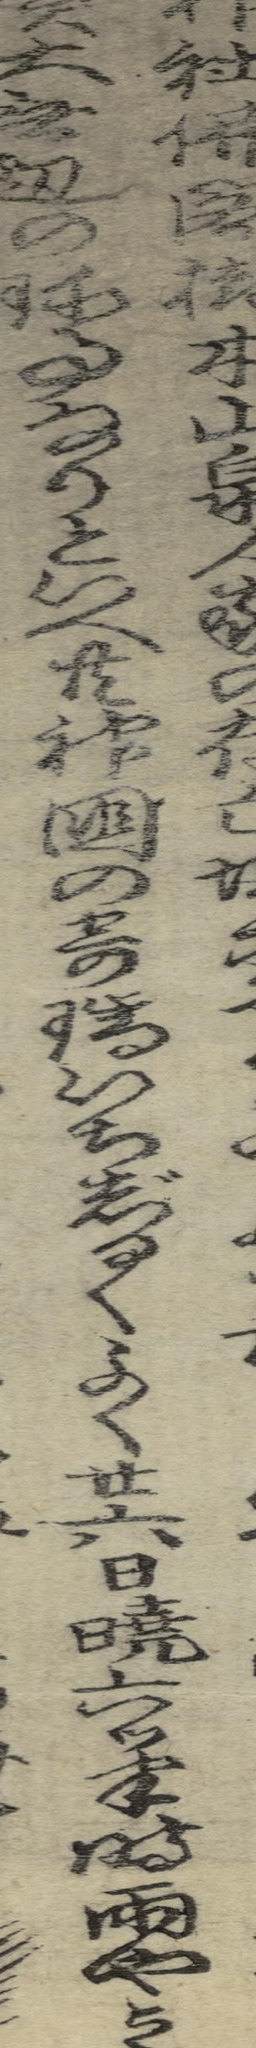広大無辺の珍事なりといへ共神国の奇瑞いちじるしくよく廿六日暁六ッ半時雨やみ
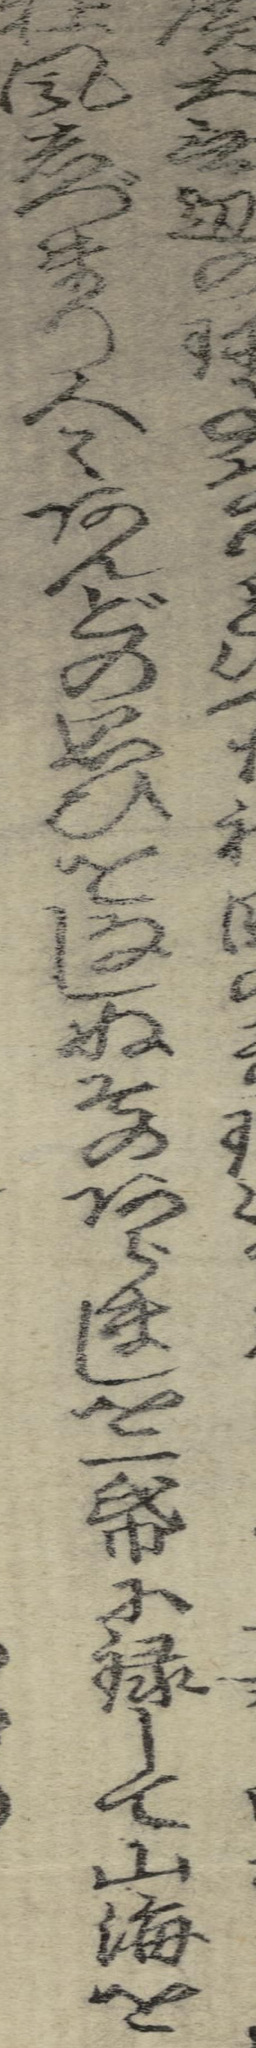狂風しづまり人々あんどの思ひをなしぬそのあらましを一紙に録して山海を
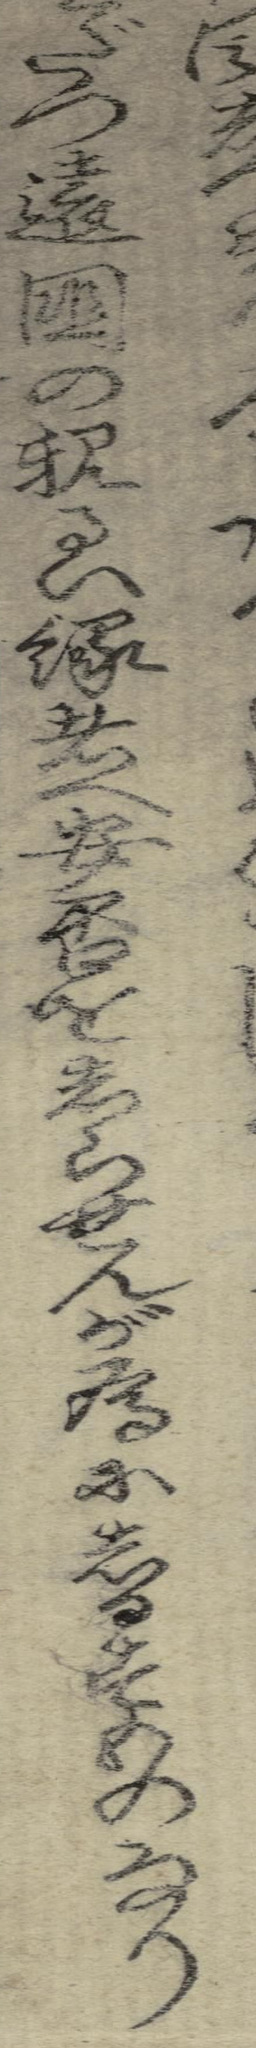へだつ遠国の親るい縁者へ安否をしらせんが為にしるすものなり
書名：江戸十里四方大風出水焼失　場所附
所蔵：東京大学地震研究所図書室 Earthquake Research Institute Library, The University of Tokyo, JAPAN
